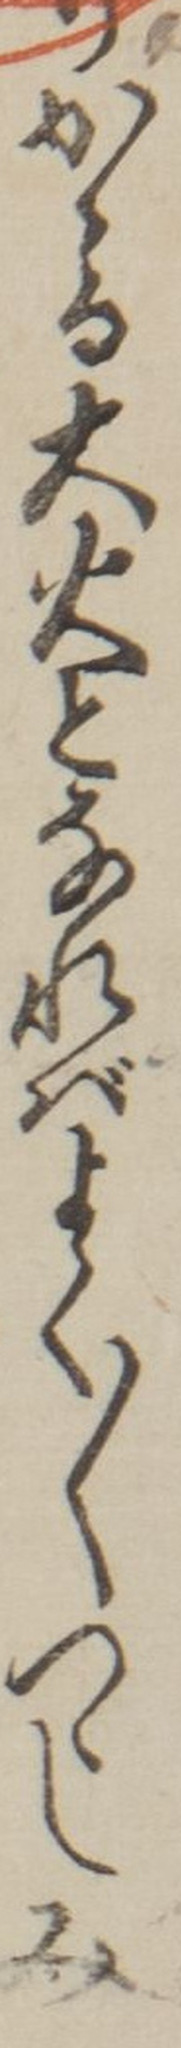火よりかゝる大火となればよく〳〵つゝしみ
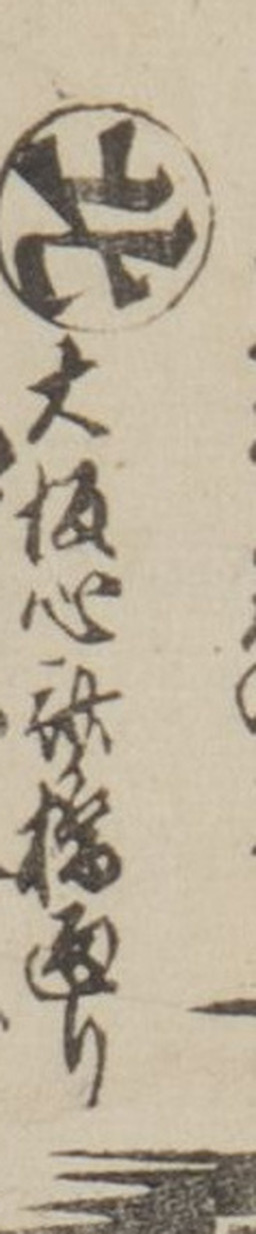大坂心斎橋通り
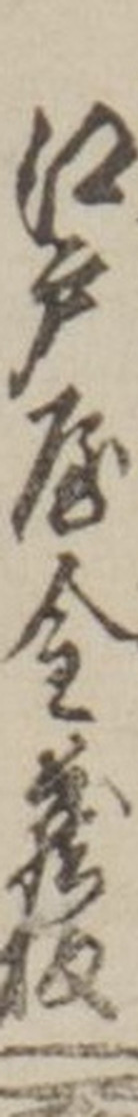江戸屋金蔵板
